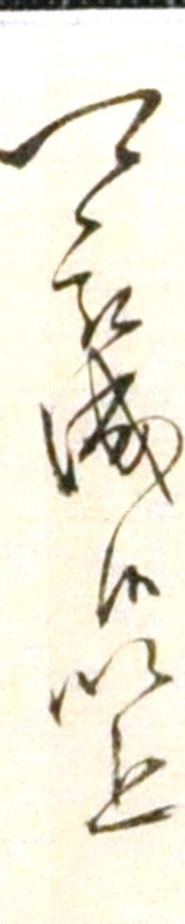可被成候以上
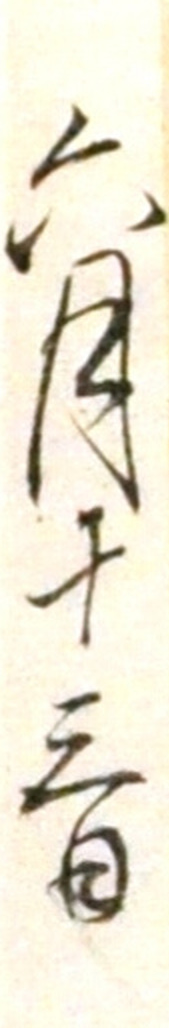六月十三日

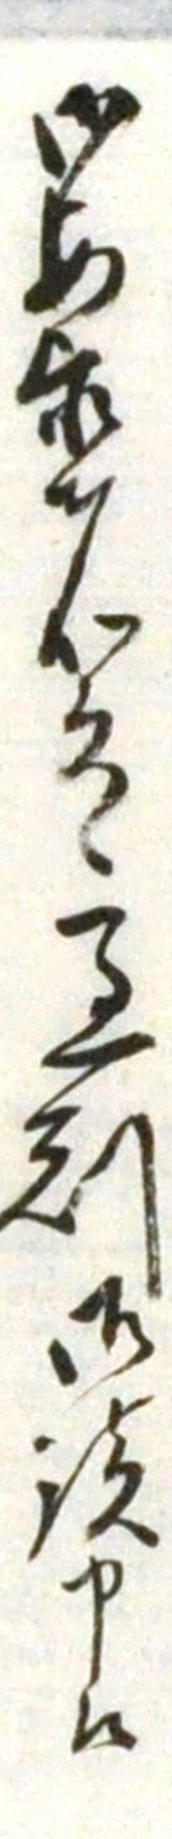御安泰奉賀候過刻御談申候
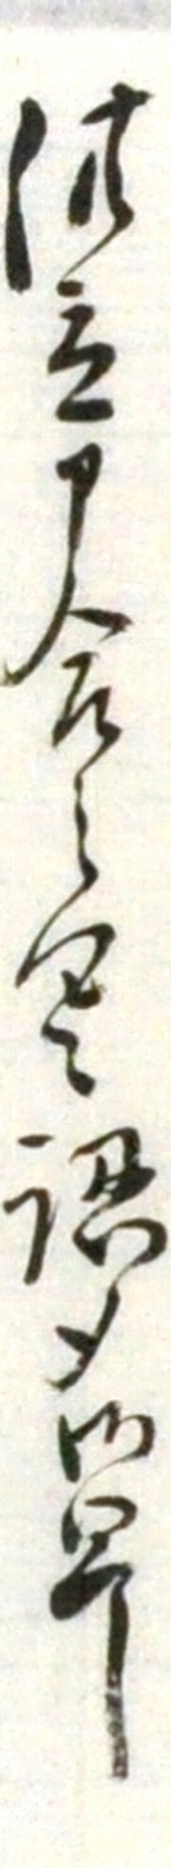供立申合之写認メ御廻し
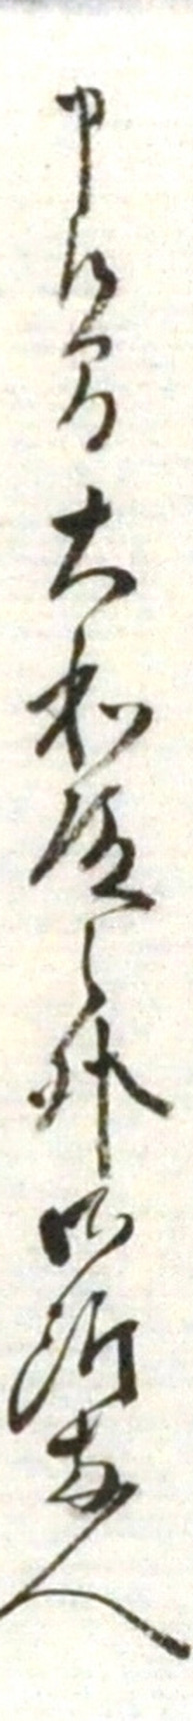申候間大和殿之外御所両人
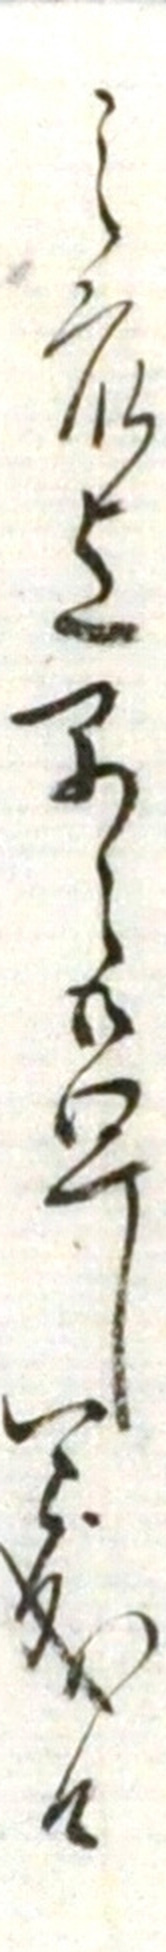之衆迄早々御廻し可被成候
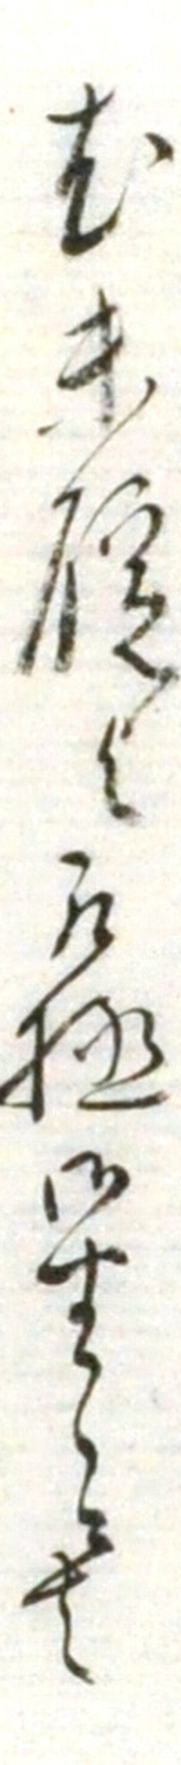尤未聢と取極御坐候には
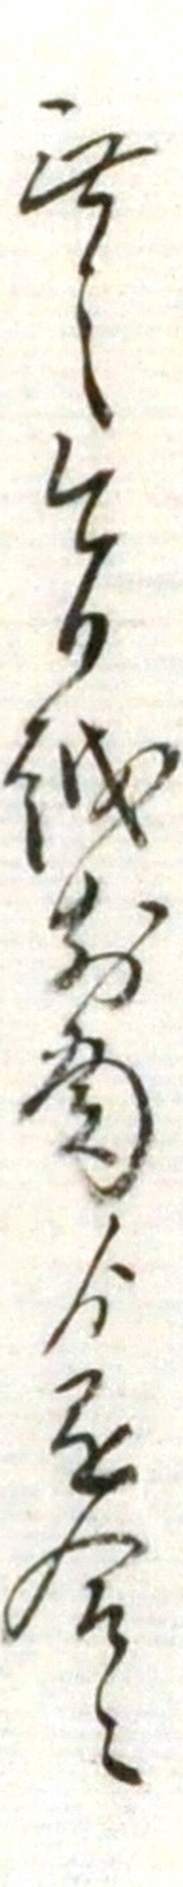無之今日越前殿ゟ懸合に
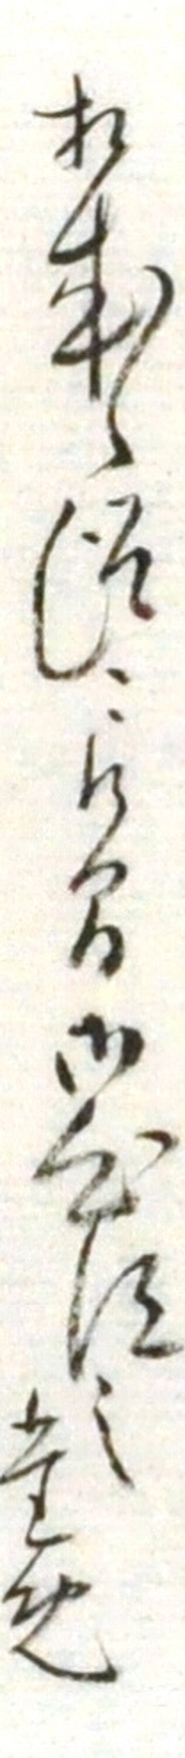相成候趣に候間御心得之ため
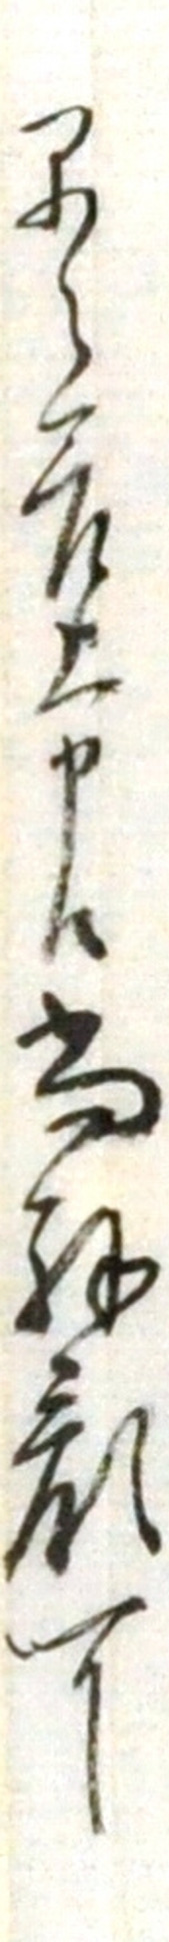早々差上申候尚拝顔可
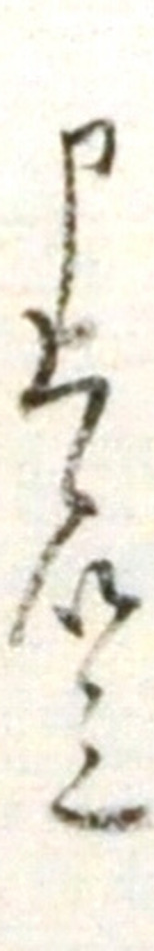申上候以上

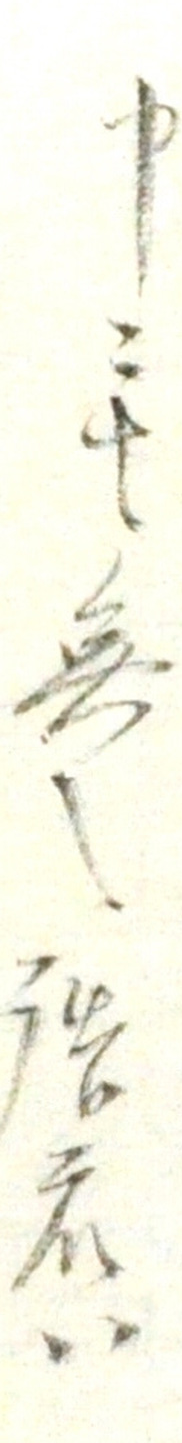申には無之詰衆は
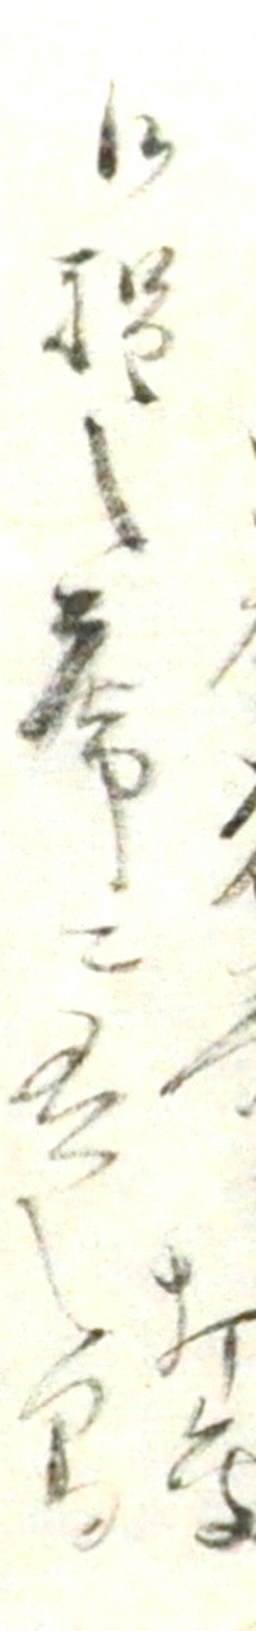候程之席に有之間
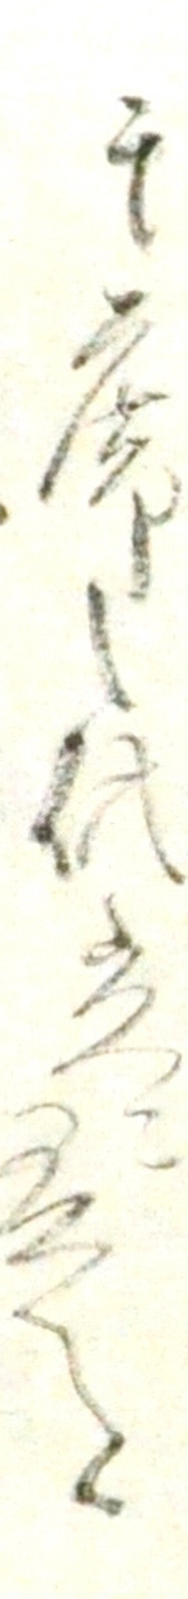其席之供立に有之候
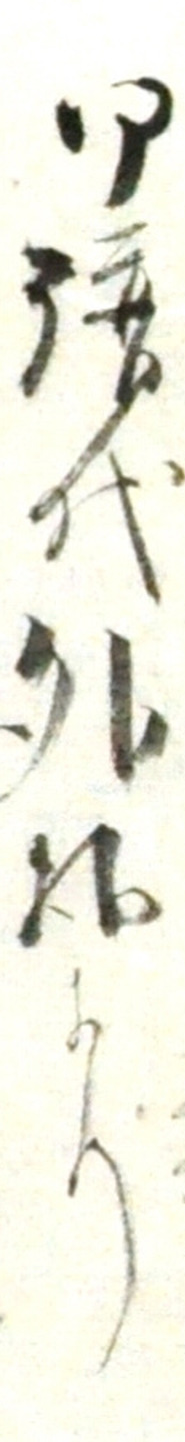御譜代外様より
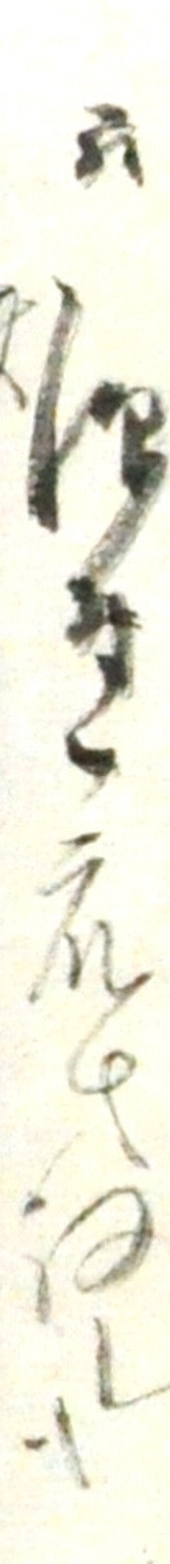被仰付候衆は何レも
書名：申合書付
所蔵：伊那市立高遠町図書館・合同会社AMANE
